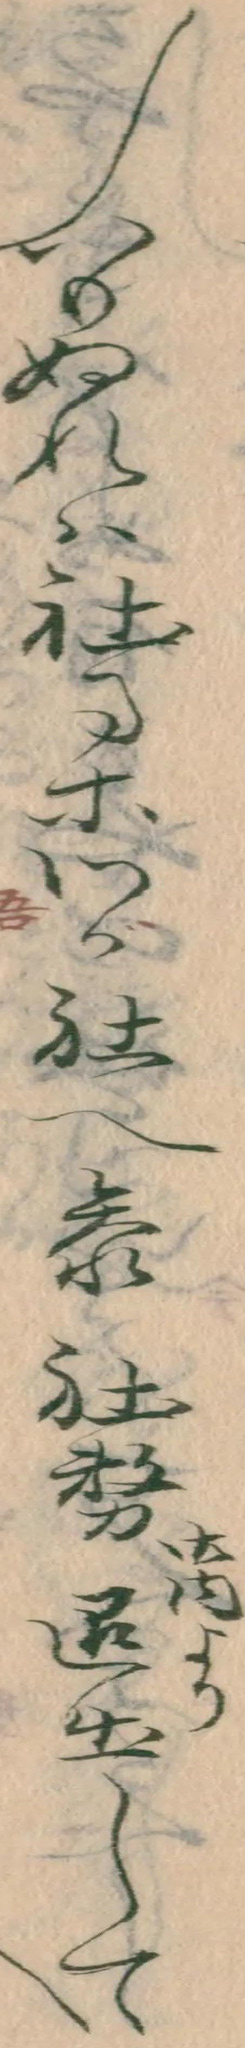いもぬれは社司等わが社へ参社務御内より退出して
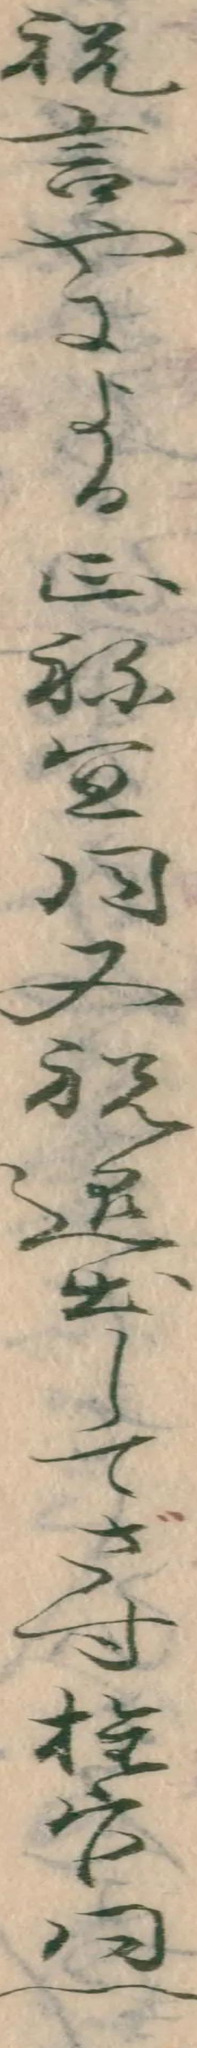祝言やによる正祢宜同又祝退出してざす権官同
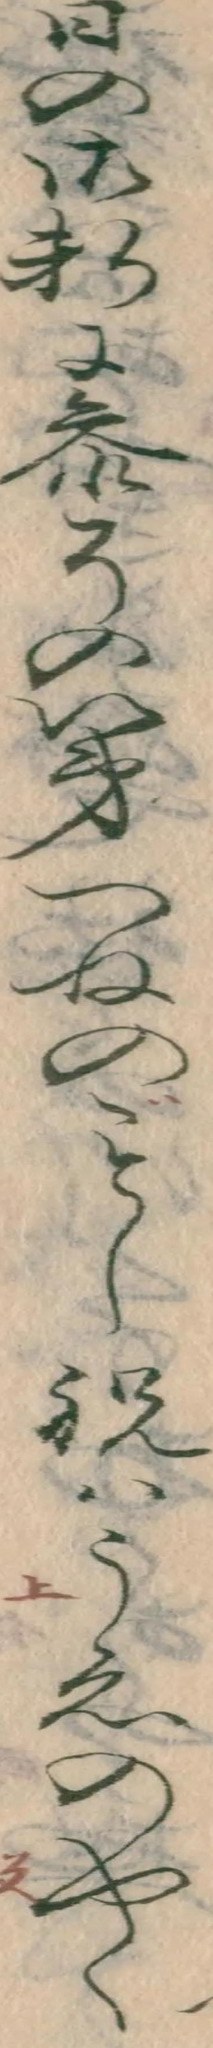日の御料に参その次第つねのごとし祝はうえのやく
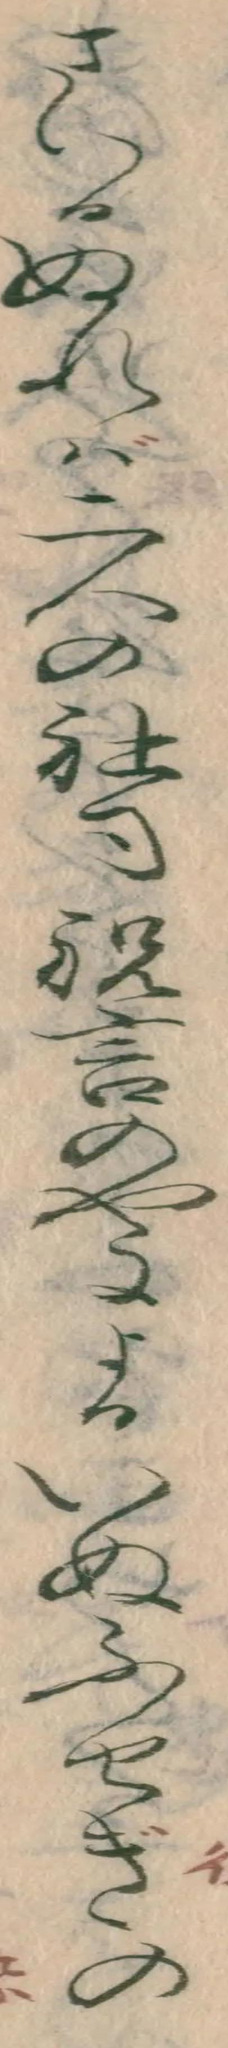まいるぬれば二人の社司祝言のやによるはいぬふせぎの
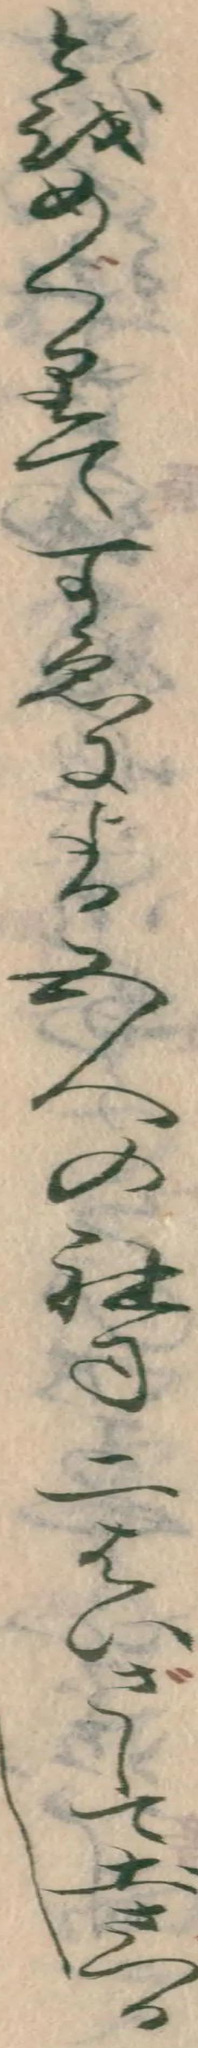とをめぐりてすゑによる五人の社司二はいざして土まつる
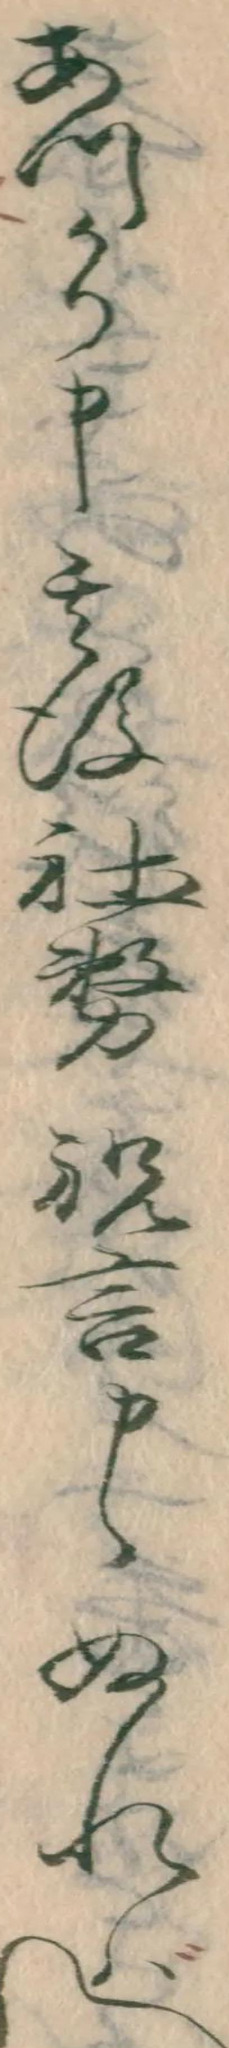あつかり申其後社務祝言申しぬれば
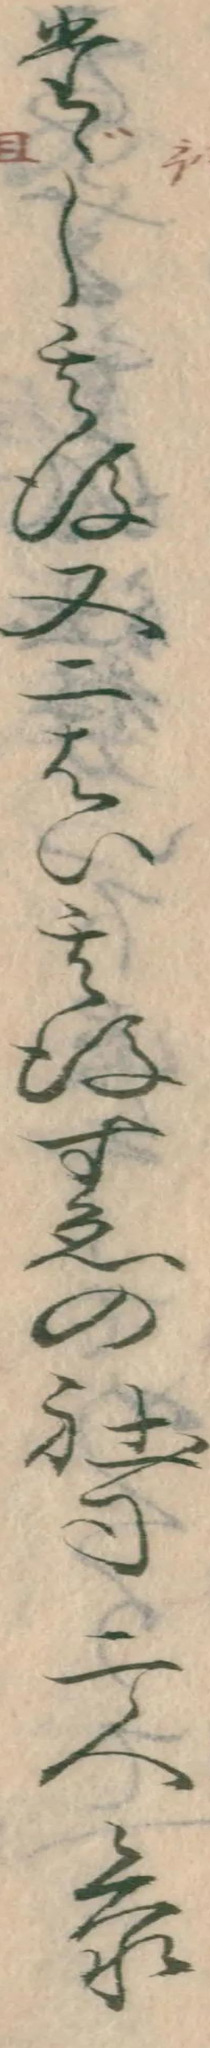たゞし其後又二はい其後すゑの社司二人参
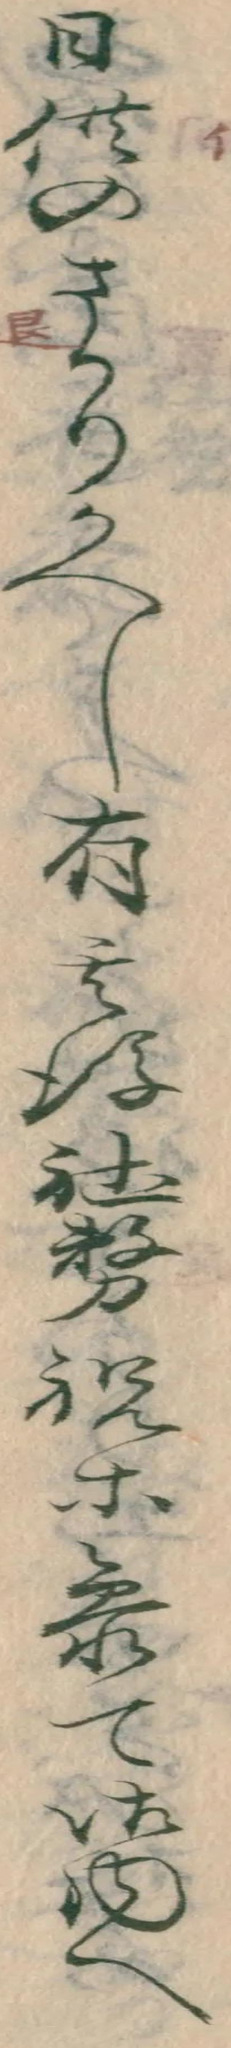日供のさかりかへし有其後社務祝等参て御内へ
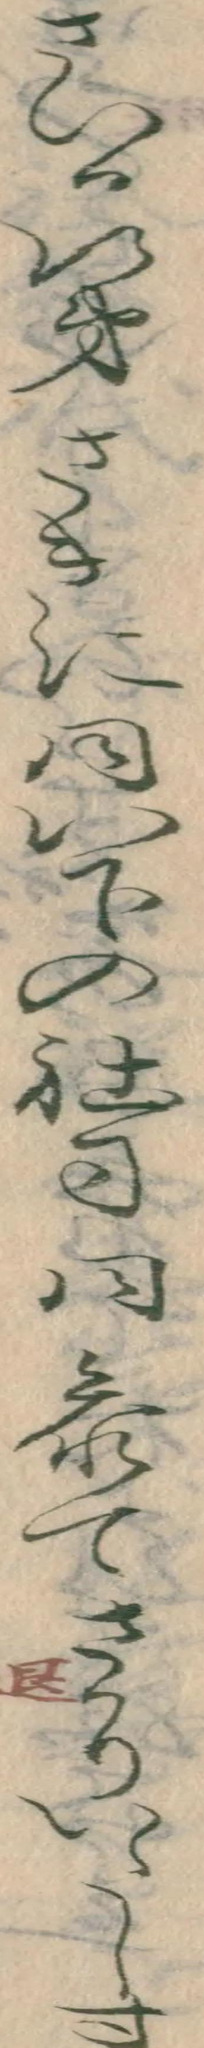まいる次第さきに同以下の社司同参てさかりいたしす
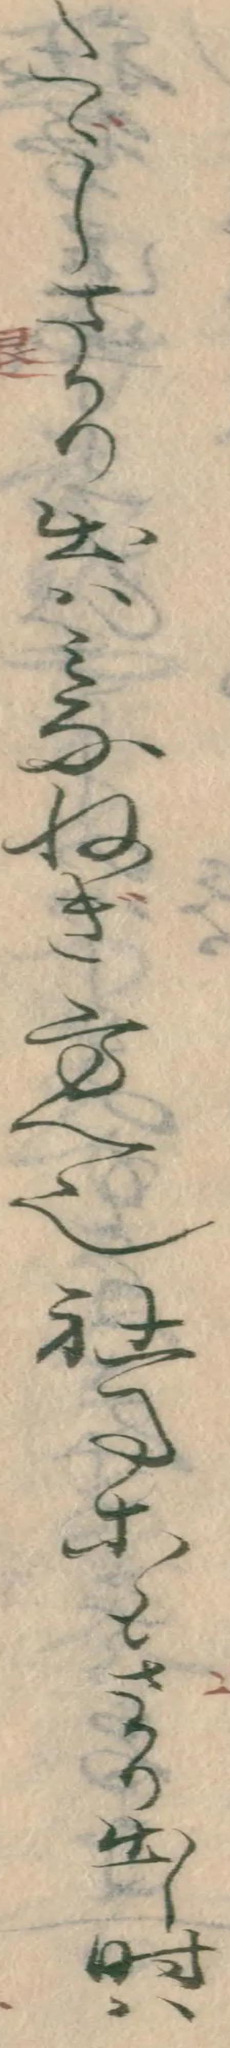たゞしさかり出はみなねぎ方へ也社司等もさかり出し時は
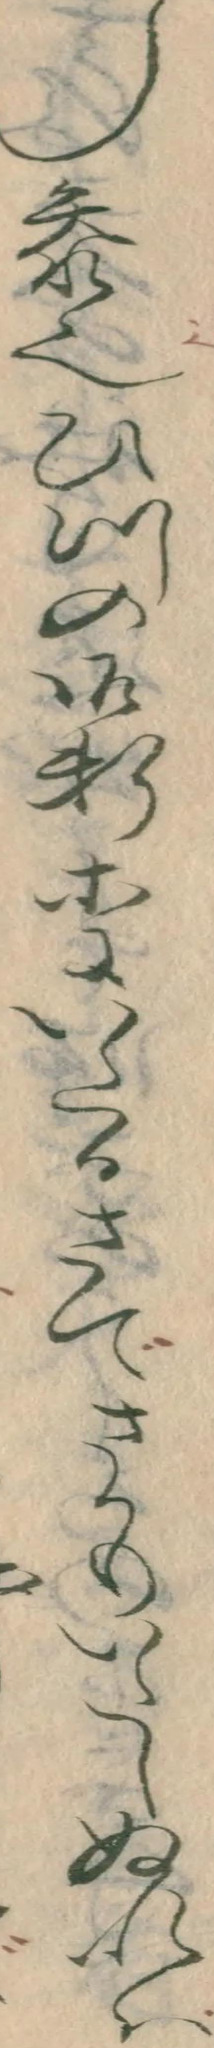参也ひつの御料等にいたるまでさかりいたしぬれば
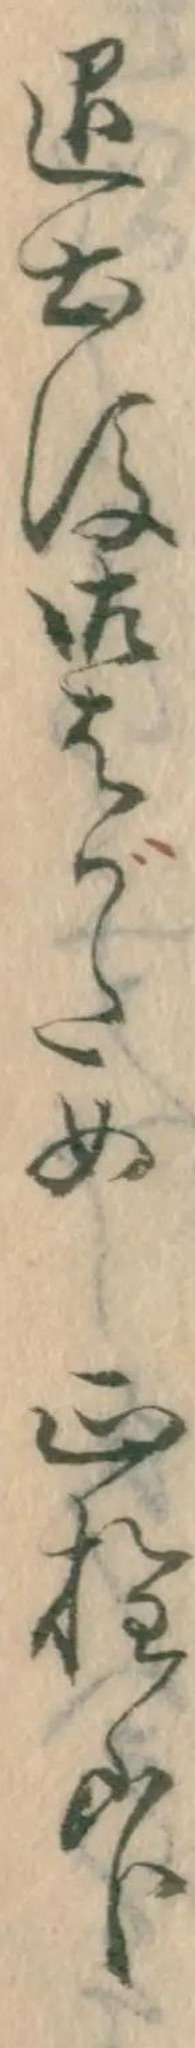退出後御はがため正権官

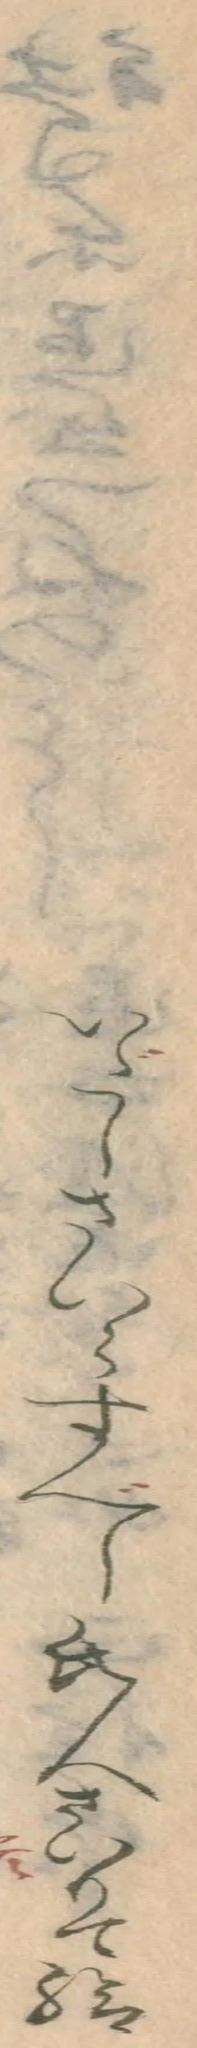いだしまいらすべし氏人まいりて給
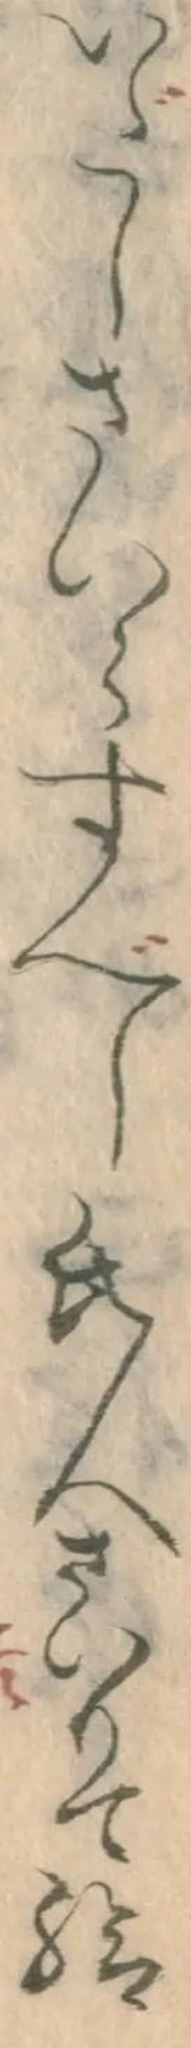いだしまいらすべし氏人まいりて給
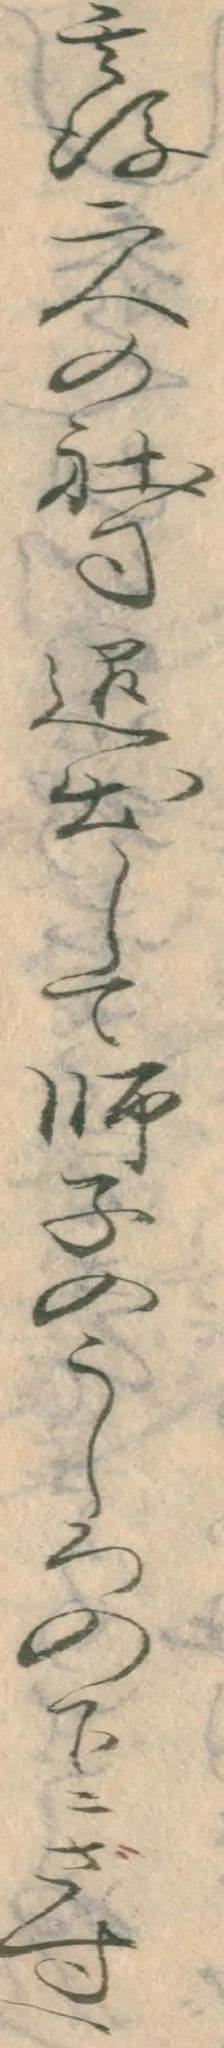其後二人の社司退出して師子のうしろの下にざす
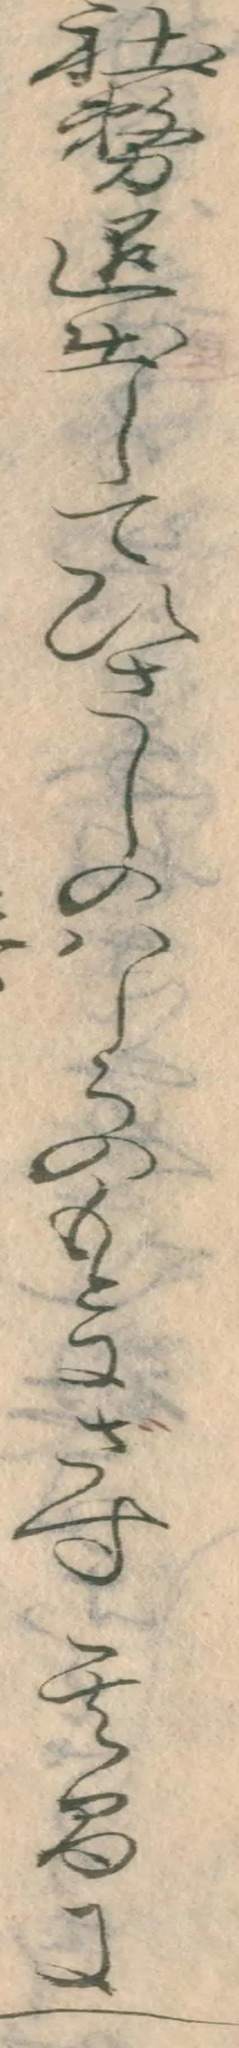社務退出してひさしのはしらのもとにざす其間に
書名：賀茂社記録. 第3冊
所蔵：国立国会図書館 National Diet Library, JAPAN
